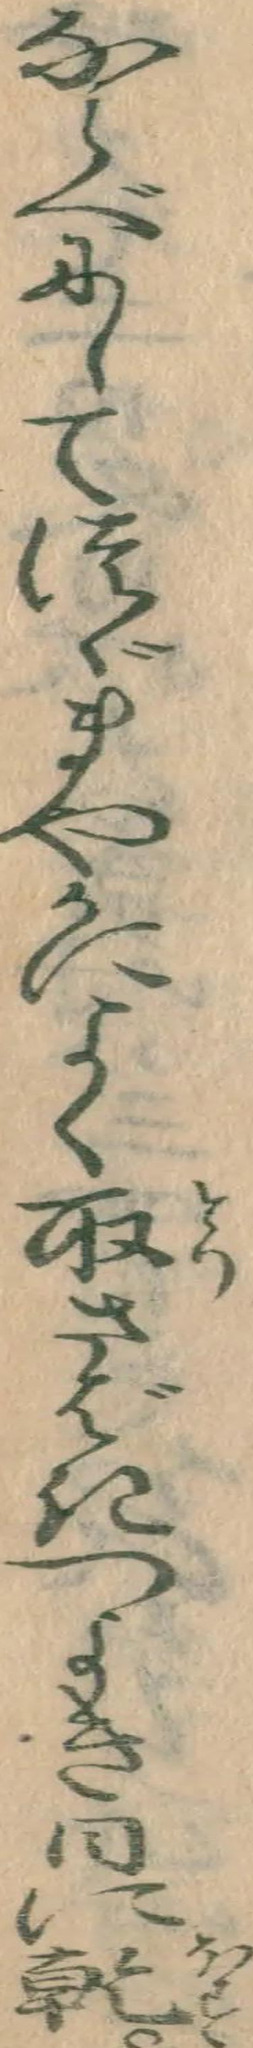ならべにしてつゞまやかによく取さばきつよき日に乾。

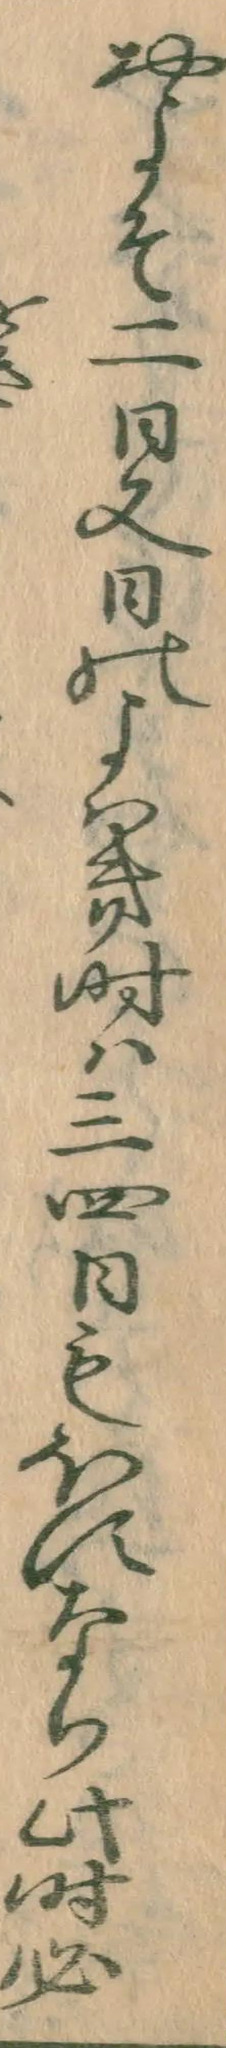およそ二日又日のよはき時は三四日もほすなり此時必
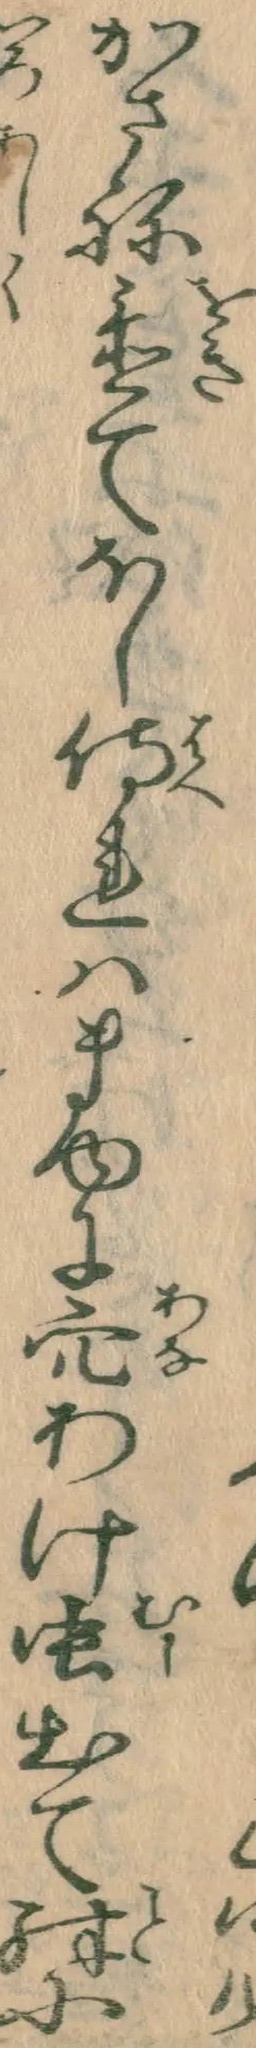かさね置てほし侍れはまゆに穴あけ虫出て殊に
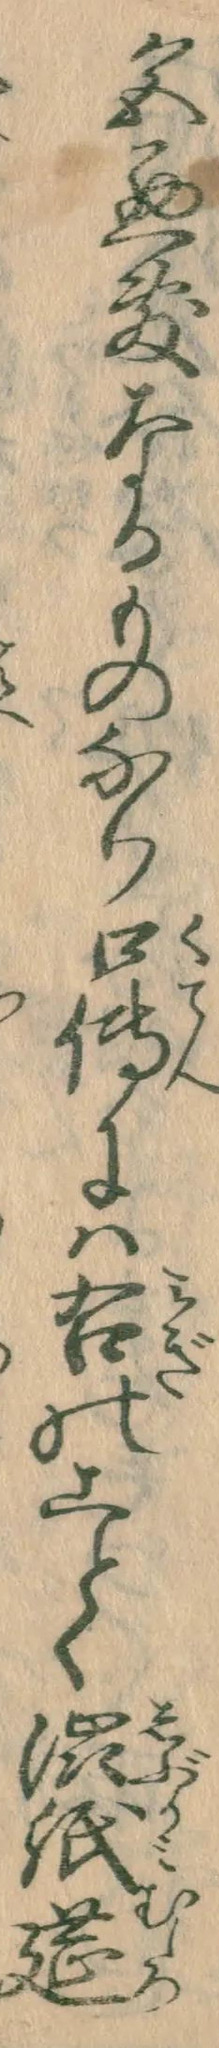色悪敷なるものなり口伝には右のことく渋紙筵
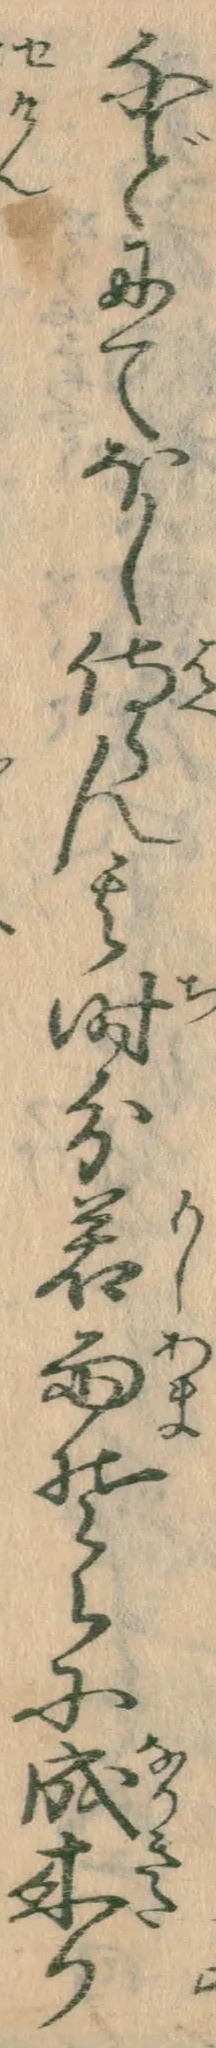などにてほし侍らん其時分若雨そらに成来り
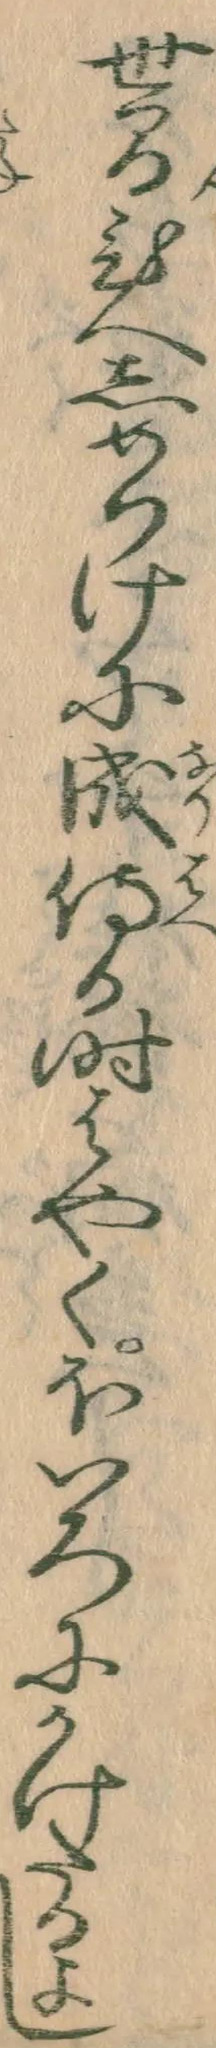世間ひへしめりけに成侍る時はやく。ほいろにかけたるよし
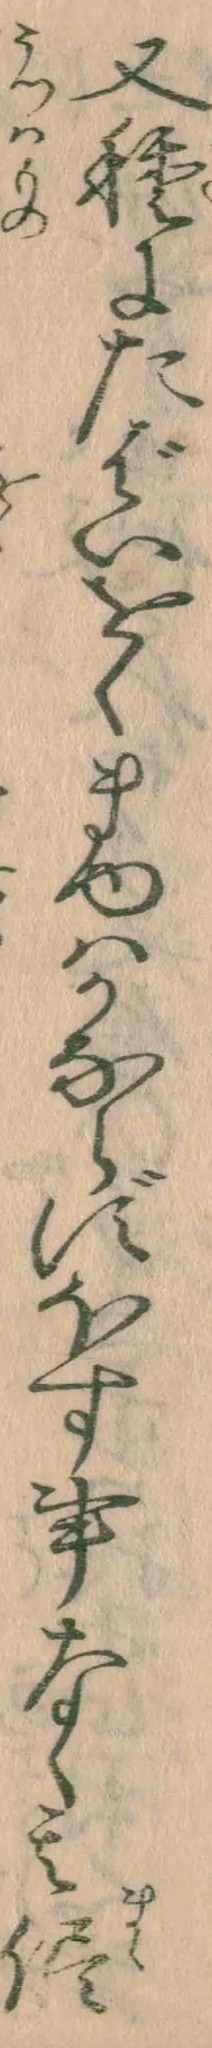又種にたばいをくまゆはかならずほす事なく其侭
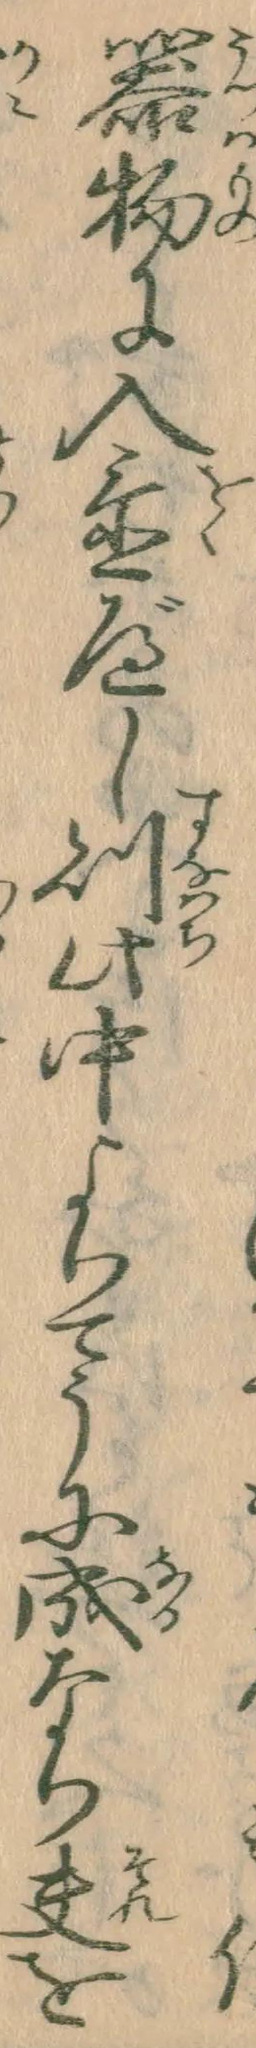器物に入置べし則此中よりてうに成なり夫を
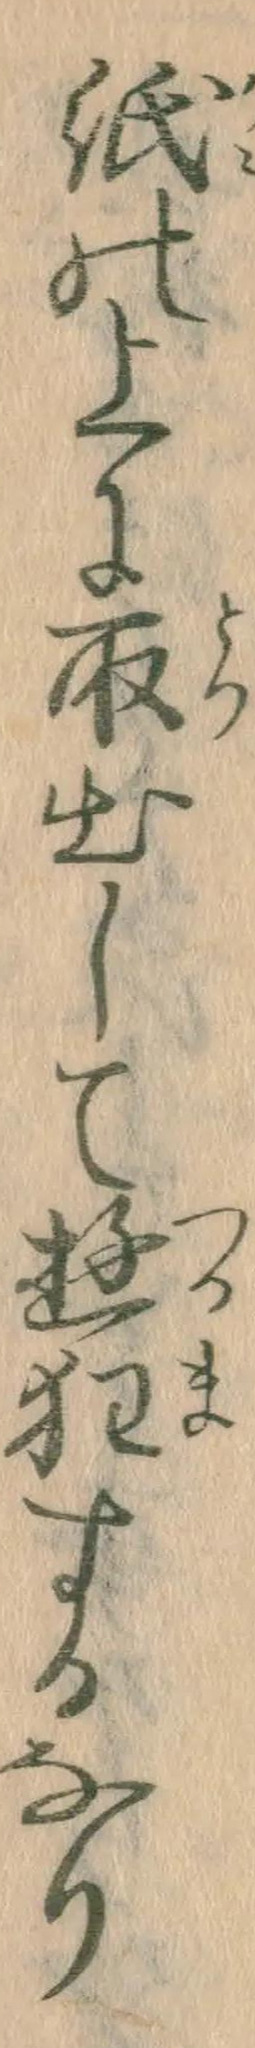紙の上に取出して遊狂するなり
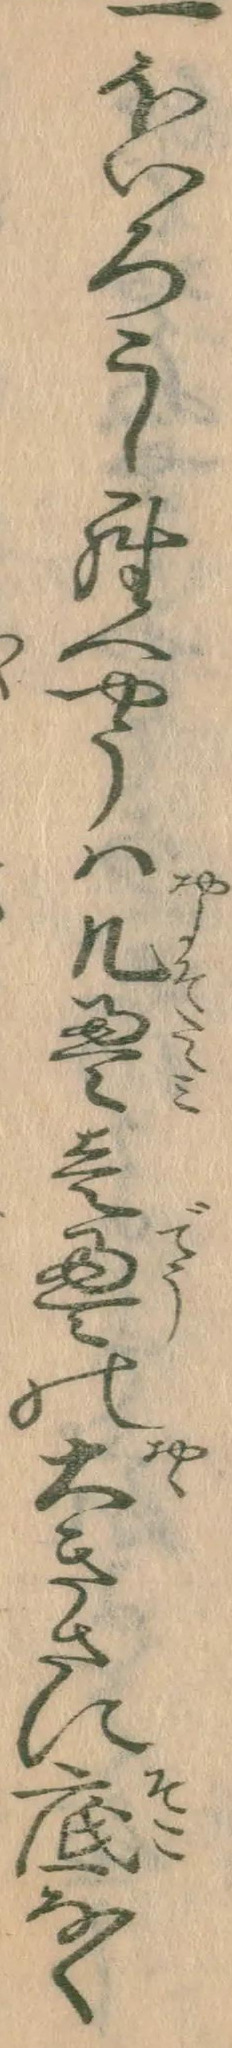一ほいろこしらへやうは凡疊壱畳の大きさに底なく
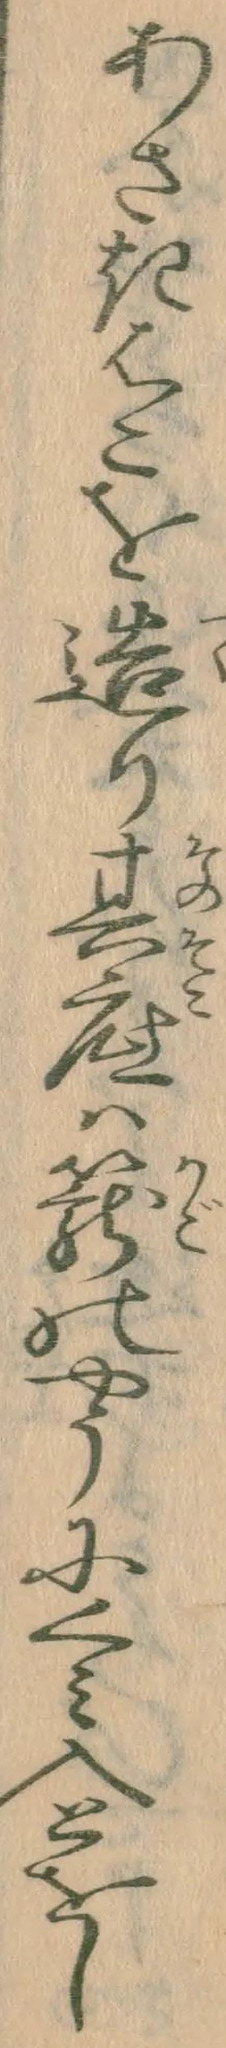あさきはこを造り其底は籠のやうにくみ入とをし
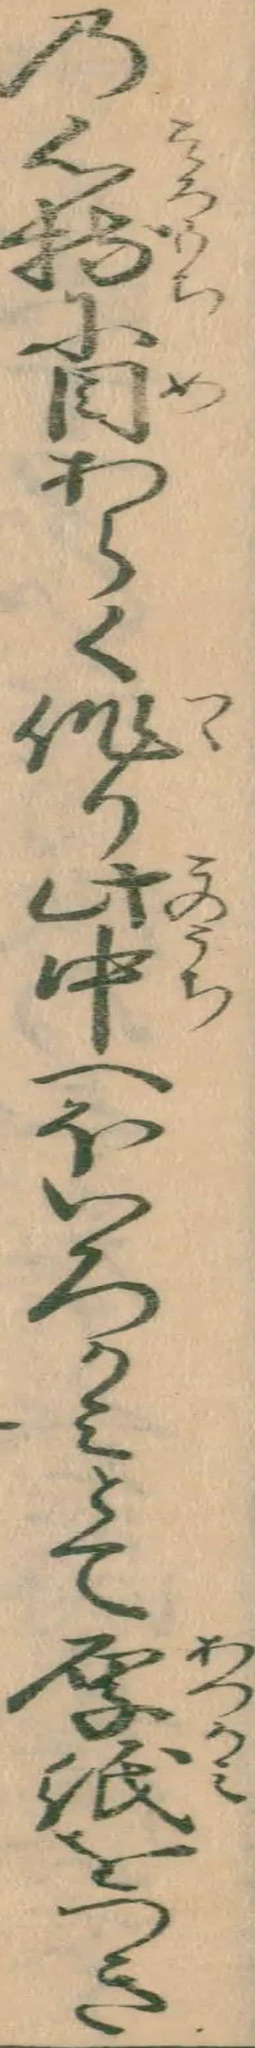の心持に目あらく作り此中へほいろかみとて厚紙をつき
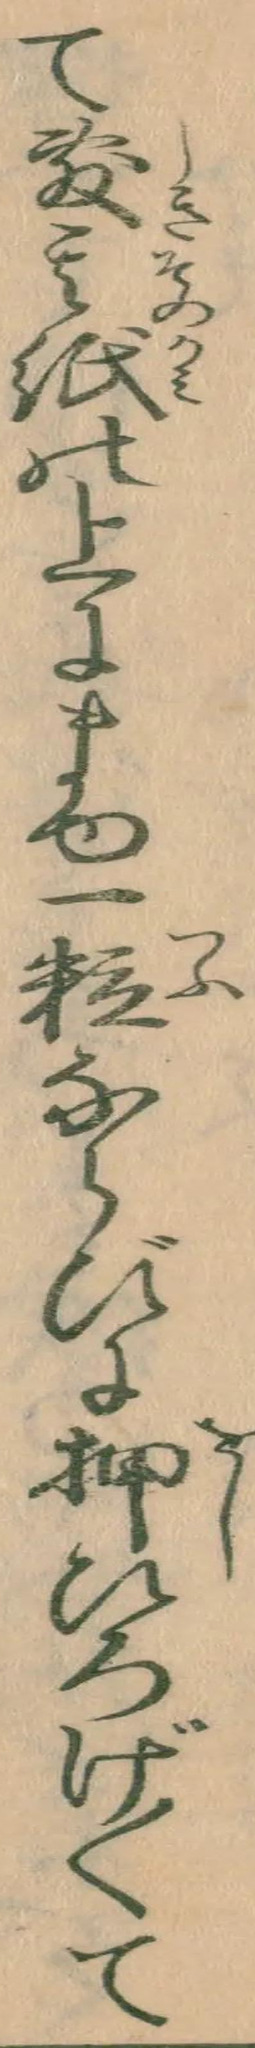て敷其紙の上にまゆ一粒ならびに押ひろげ〳〵て
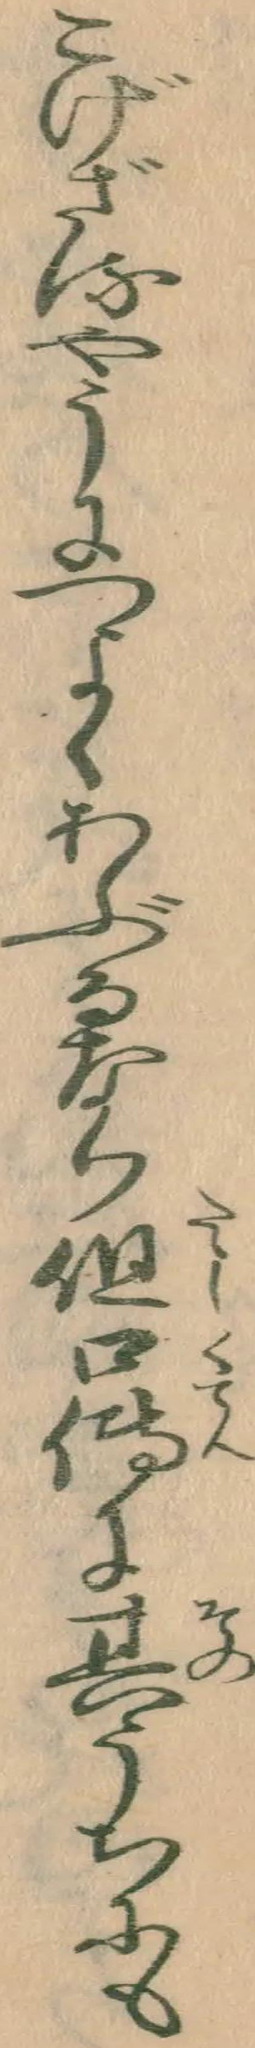こげざるやうにつよくあぶるなり但口伝に其うちにも
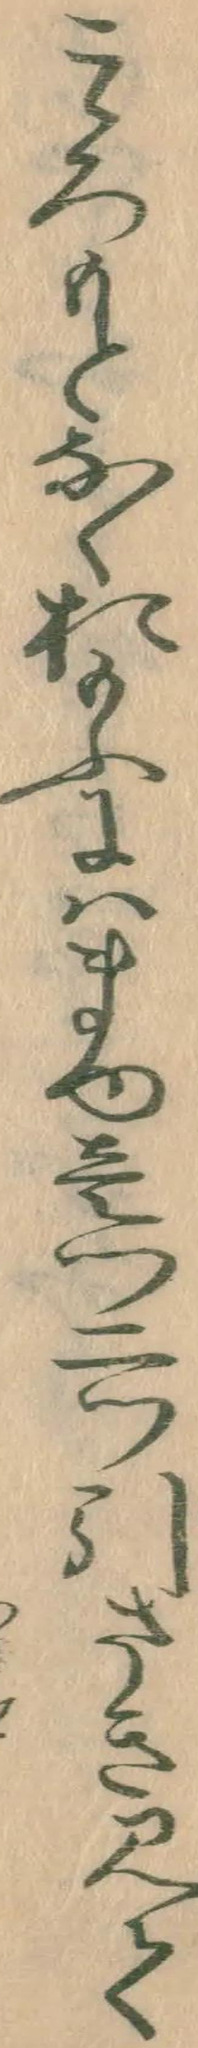こゝろもとなくおもふにはまゆ壱つ二つ引さき見て
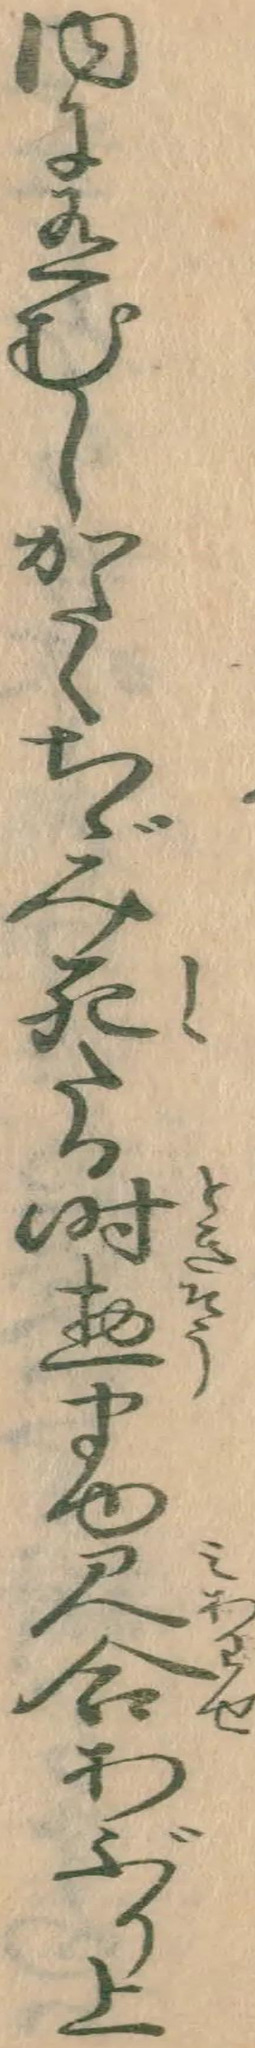内に有むしかたくちゞみ死たる時惣まゆ見合あぶり上
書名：蚕飼養法記
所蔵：国立国会図書館 National Diet Library, JAPAN
